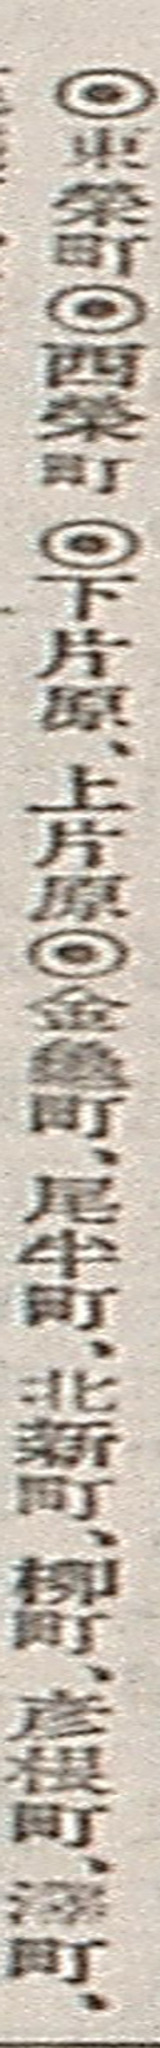⦿東栄町⦿西栄町⦿下片原、上片原⦿金亀町、尾半町、北新町、柳町、彦根町、澤町

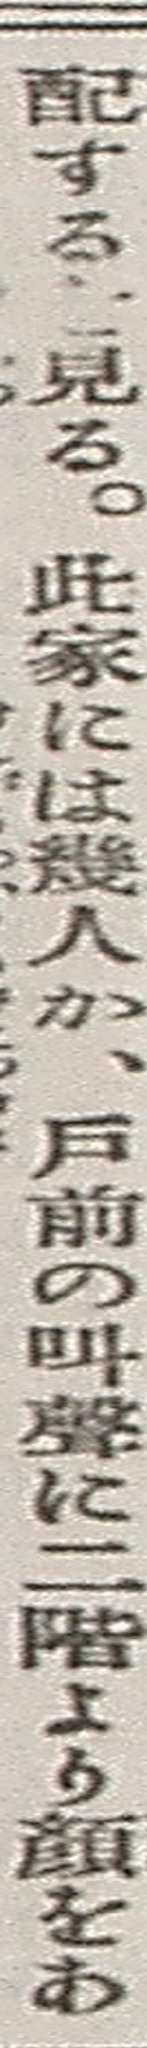配るを見る。此家には幾人か、戸前の叫声に二階より顔をあ
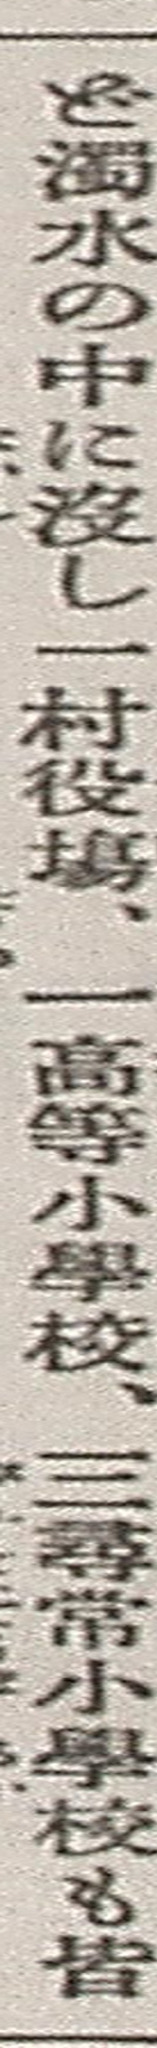ど濁水の中に没し一村役場、一高等小学校、三尋常小学校も皆
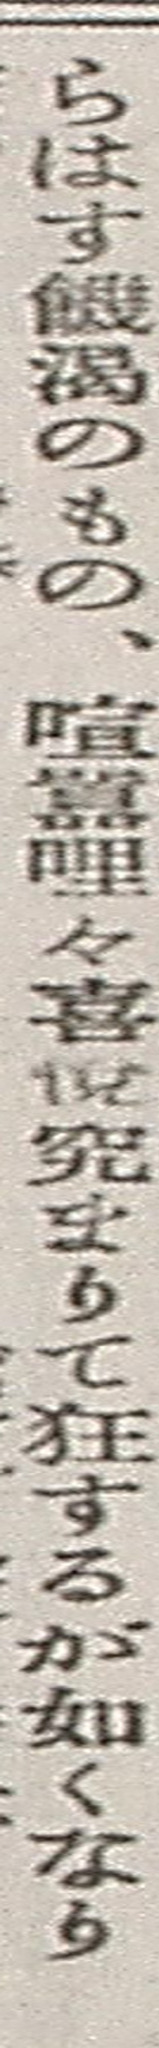らはす飢渇のもの、喧囂哩々喜悦究まりて狂するが如くなり
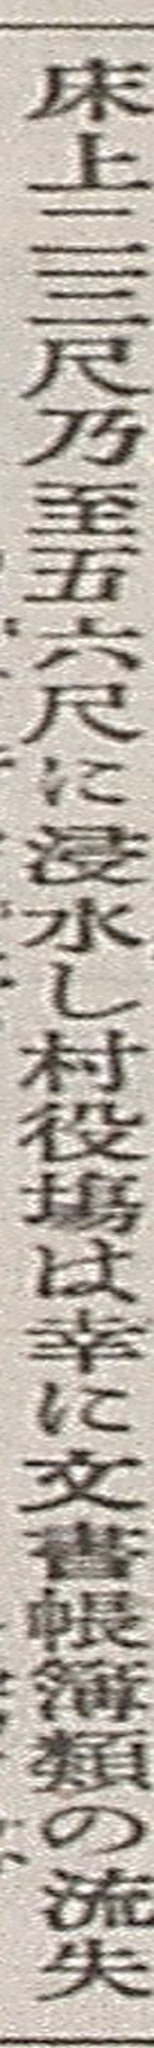床上二三尺乃至五六尺に浸水し村役場は幸に文書帳簿類の流失
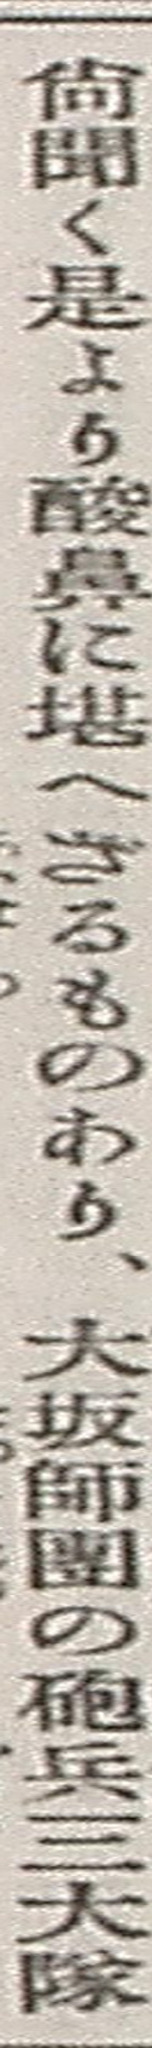尚聞く是より酸鼻に堪へざるものあり、大坂師団の砲兵三大隊
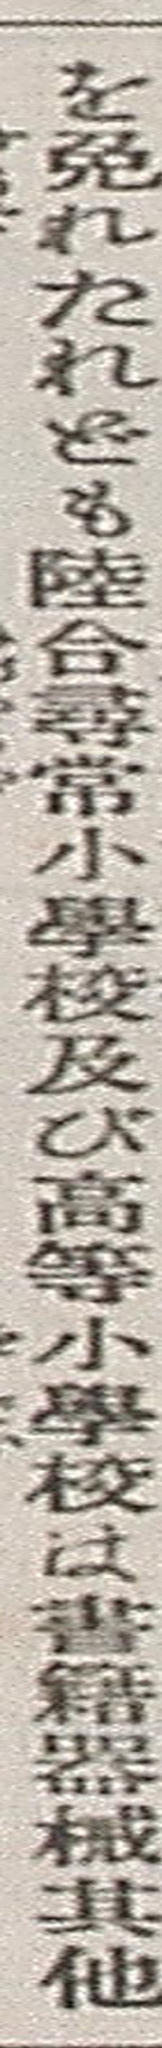を免れたれども陸合尋常小学校及び高等小学校は書籍器械其他
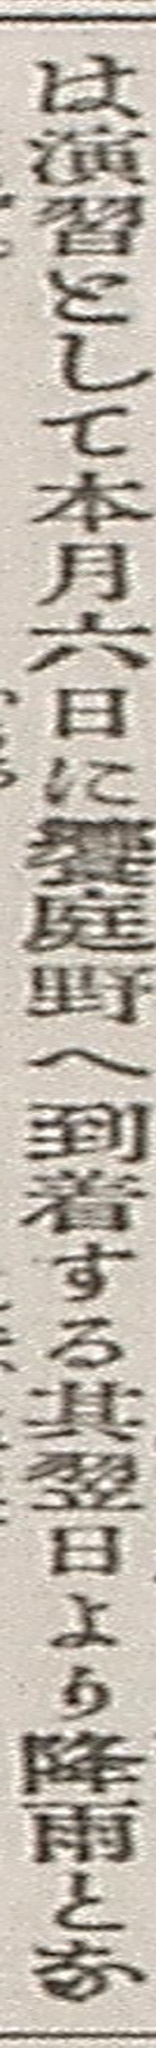は演習として本月六日に饗庭野へ到着する其翌日より降雨とな
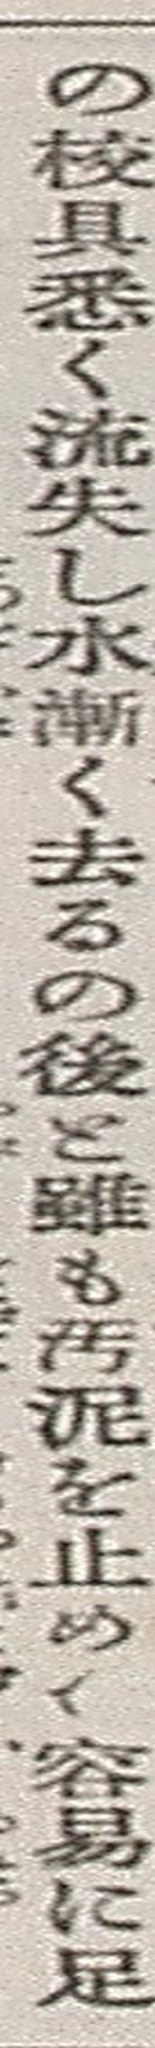の校具悉く流失し水漸く去るの後と雖も汚泥を止めて容易に足
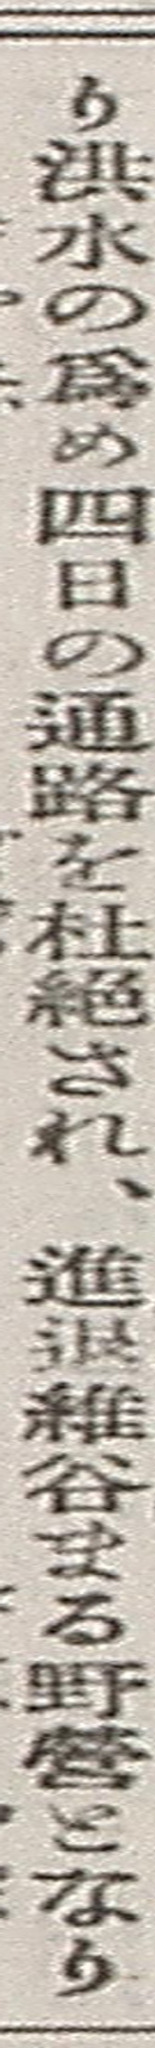り洪水の為め四日の通路を杜絶され、進退維谷まる野営となり
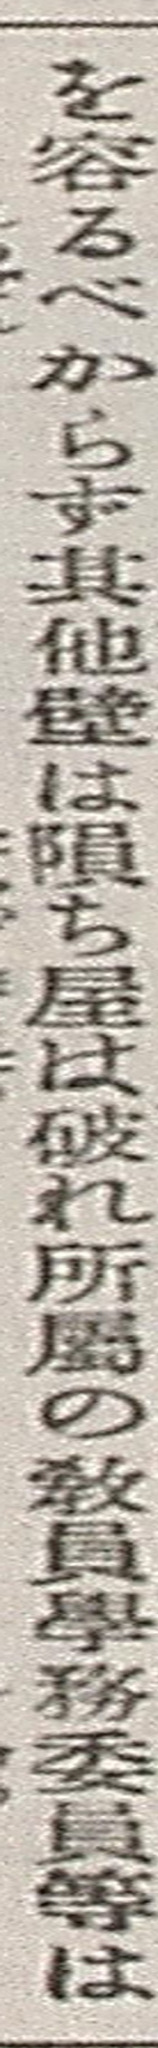を容るべからず其他壁は隕ち屋は破れ所属の教員学務委員等は
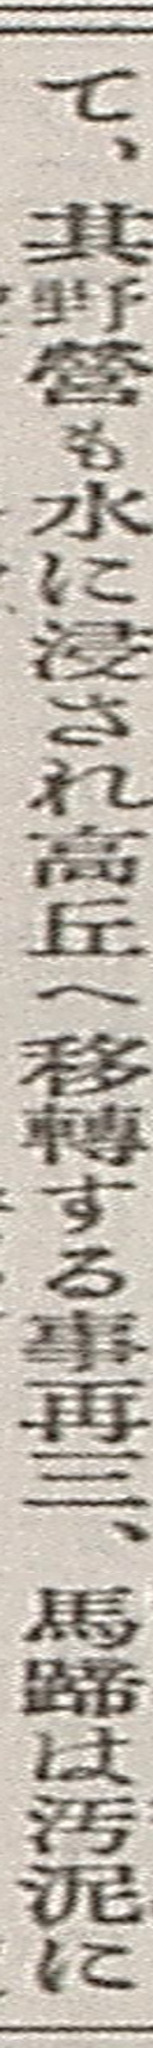て、其野営も水に浸され高丘へ移転する事再三、馬蹄は汚泥に
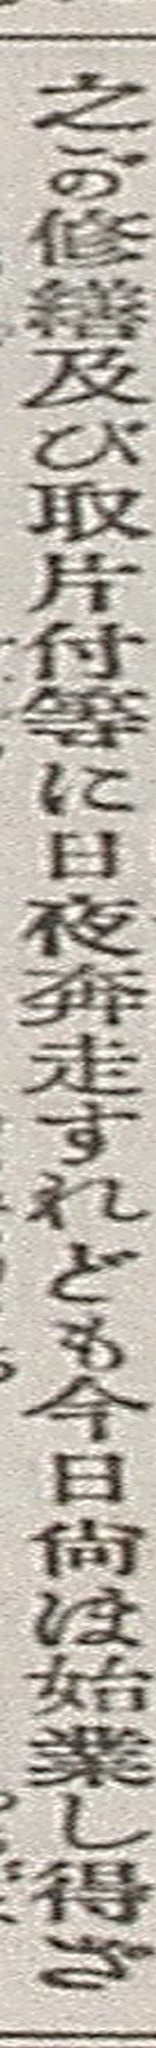之が修繕及び取片付等に日夜奔走すれども今日尚ほ始業し得ざ
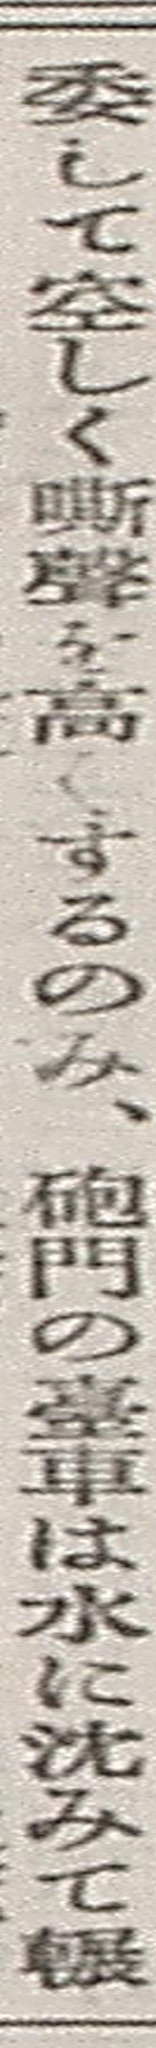委して空しく嘶声を高くするのみ、砲門の台車は水に沈みて軋
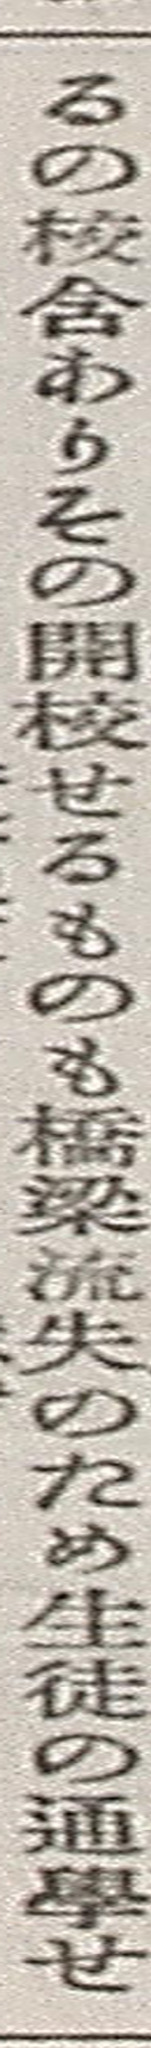るの校舎ありその開校せるものも橋梁流失のため生徒の通学せ
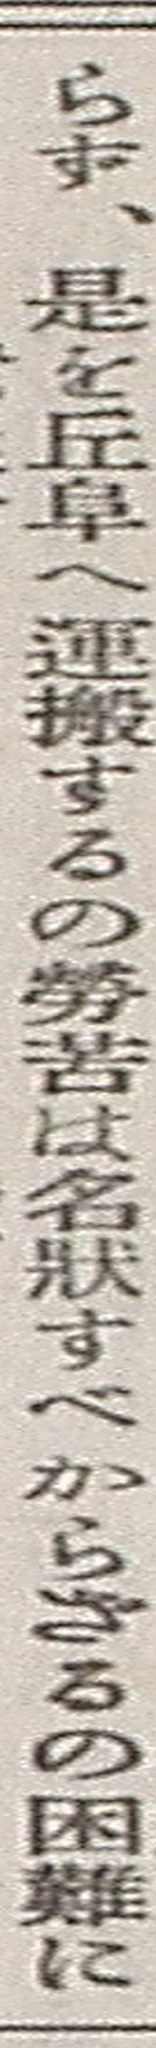らず、是を丘阜へ運搬するの労苦は名状するべかざるの困難に
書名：風俗畫報臨時増刊第百二十八號　洪水被害録（下）
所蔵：東京大学地震研究所図書室 Earthquake Research Institute Library, The University of Tokyo, JAPAN
